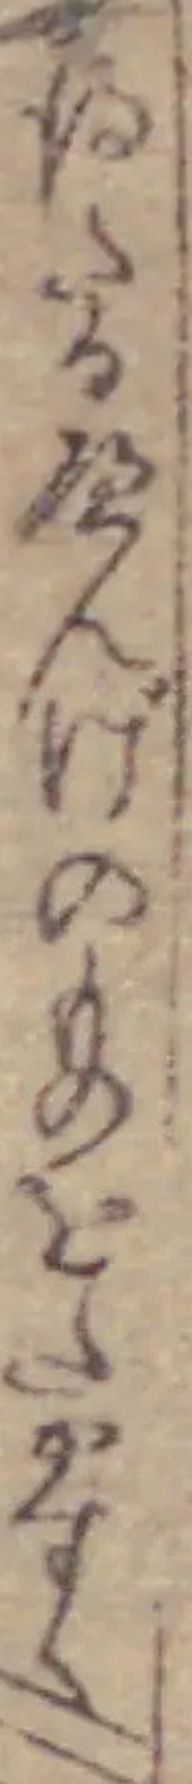得たるへんげのものをたやすく
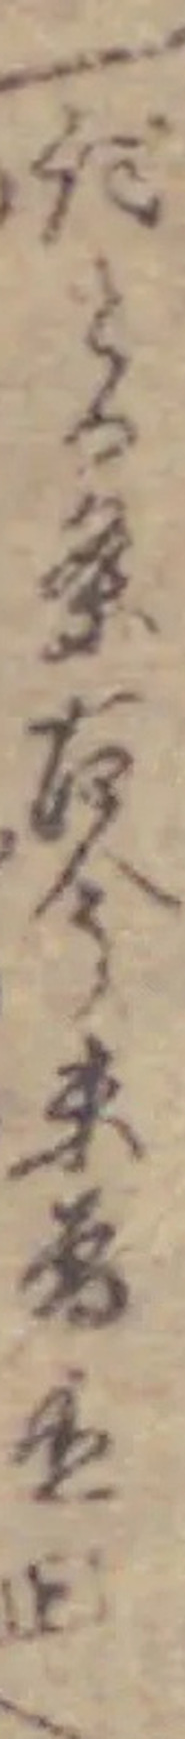討とる条古今未曾有
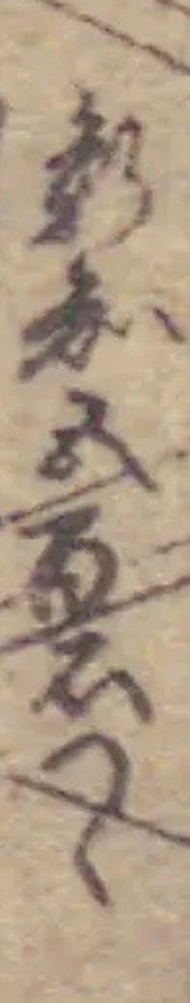新知五百石つゝ
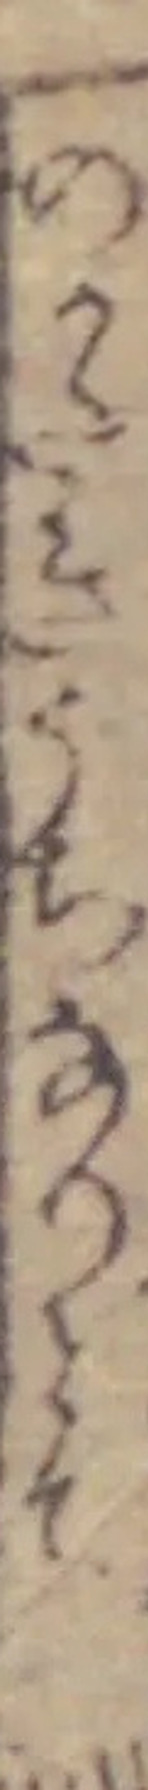のかたきうちなりとて
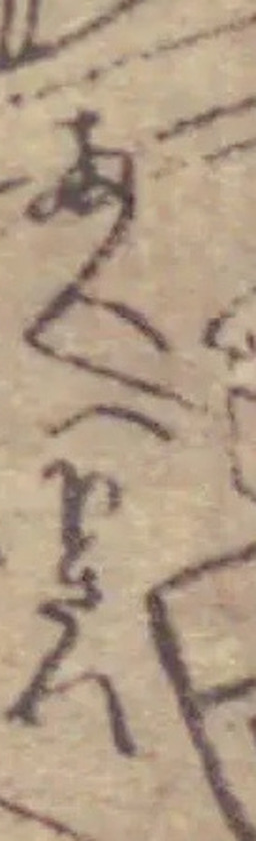両人へ下され
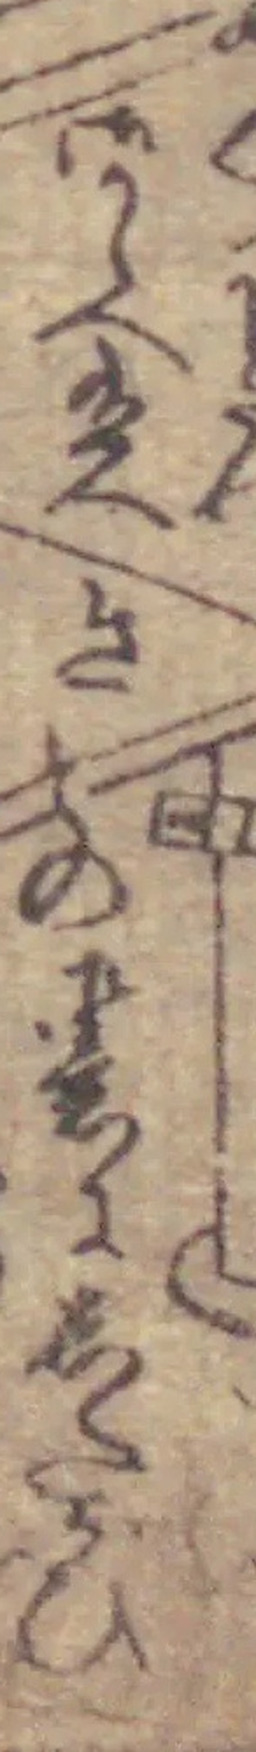御かゝへ有へきとの御意にしたがひ
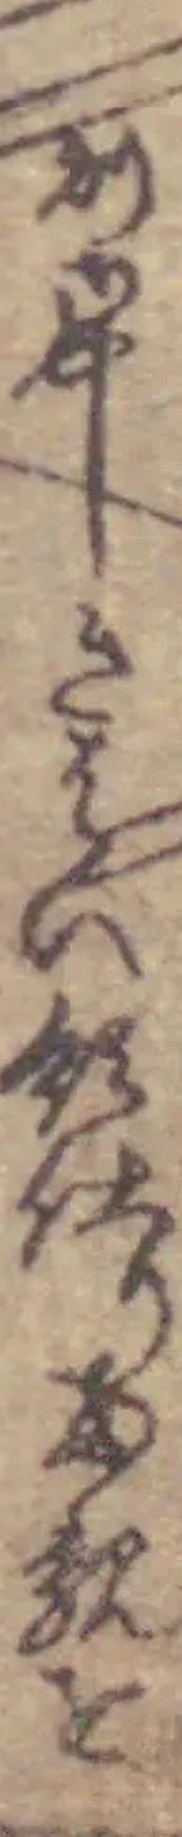則御やしきはい領仕り両親を
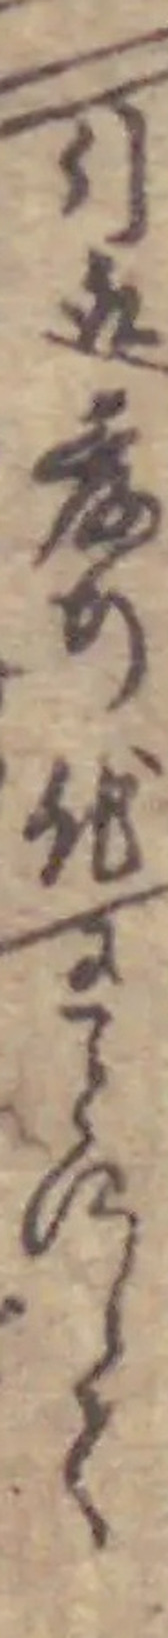引取孝行他にことにして
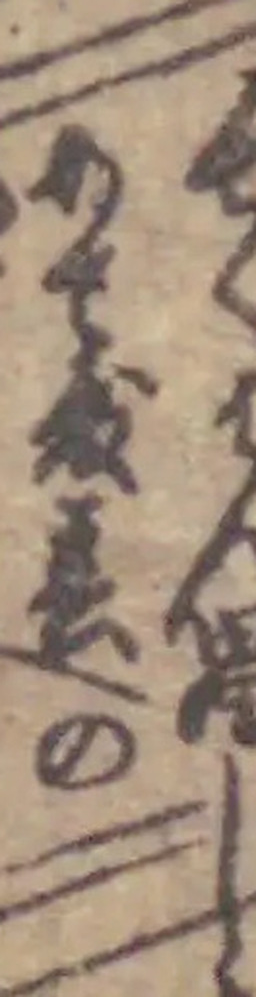めて度春の
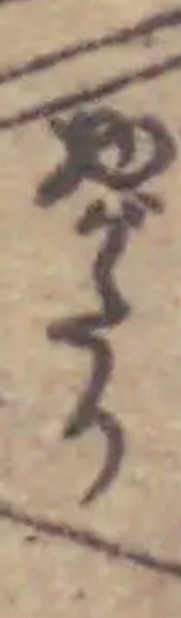物がたり
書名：妖物十番斬 2巻
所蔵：国立国会図書館 National Diet Library, JAPAN
